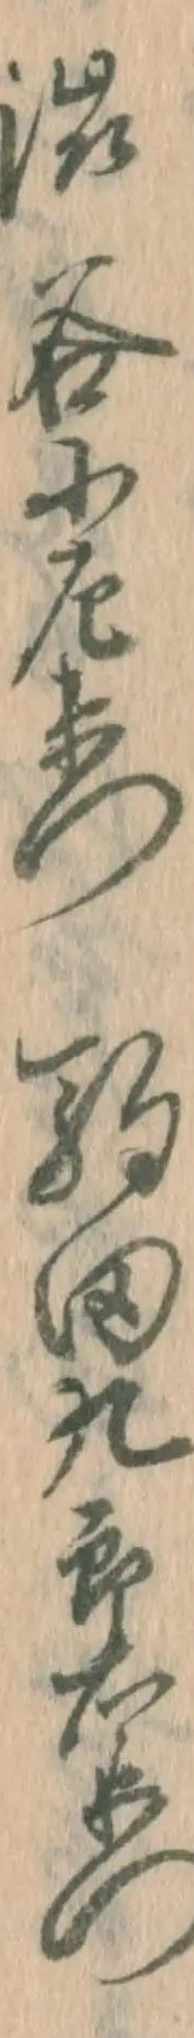渋谷小左衛門駒田九郎右衛門坂権兵
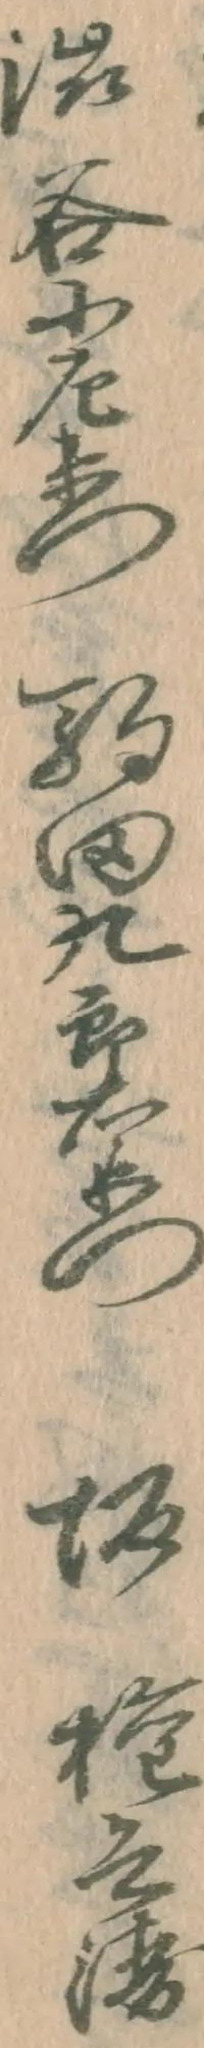渋谷小左衛門駒田九郎右衛門坂権兵
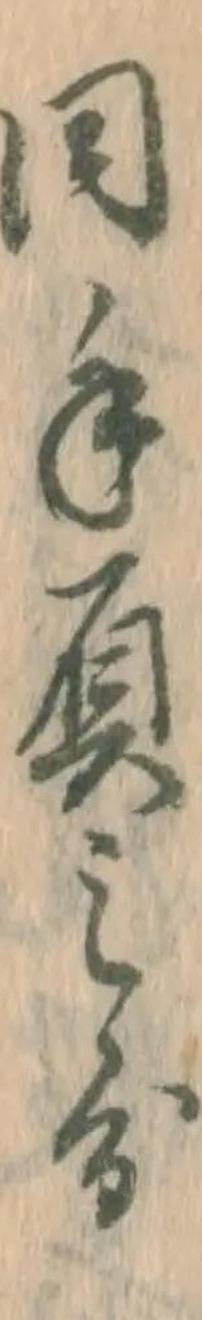同手負之分
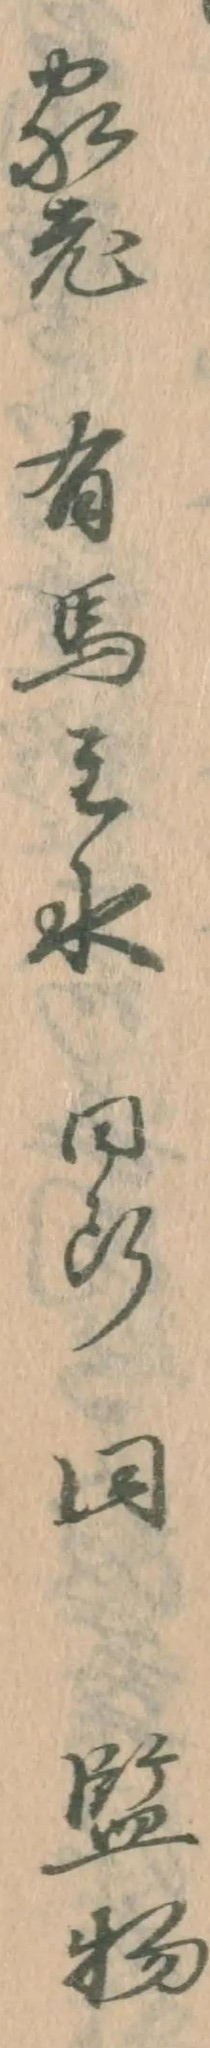家老有馬主水同断同監物
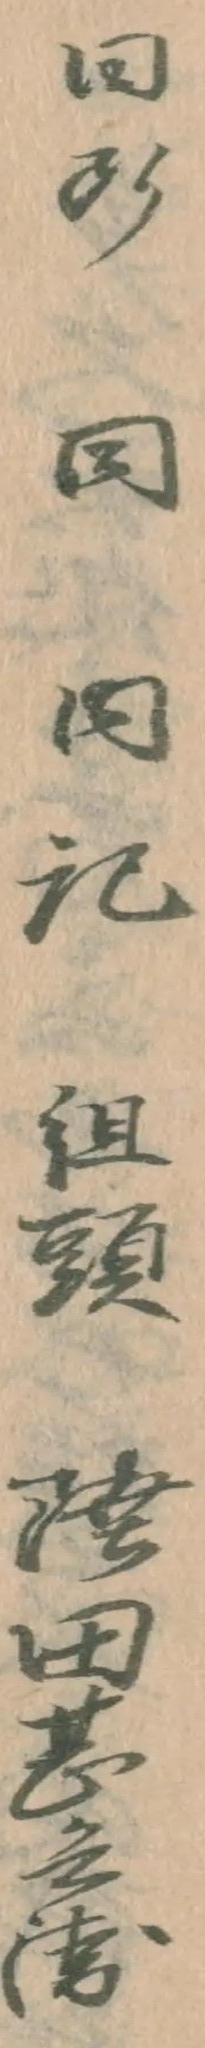同断同内記組頭陸田甚兵衛
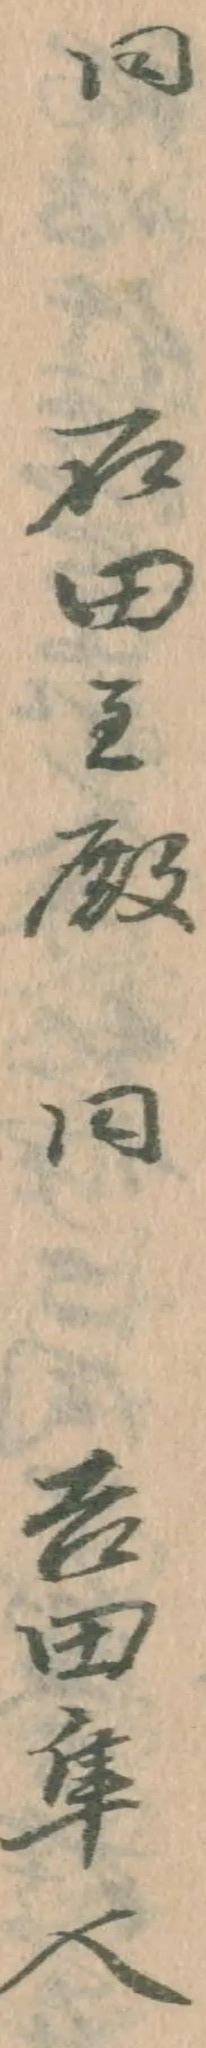同石田主殿同吉田隼人
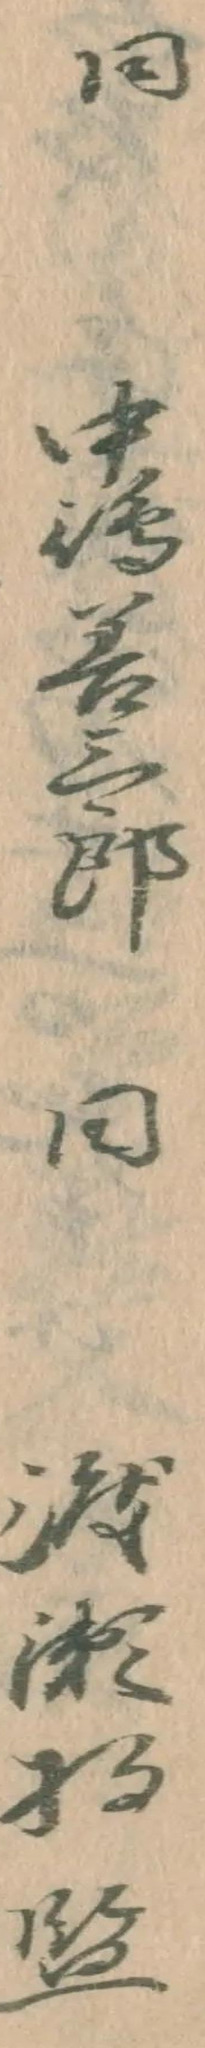同中島善三郎同渡瀬将監
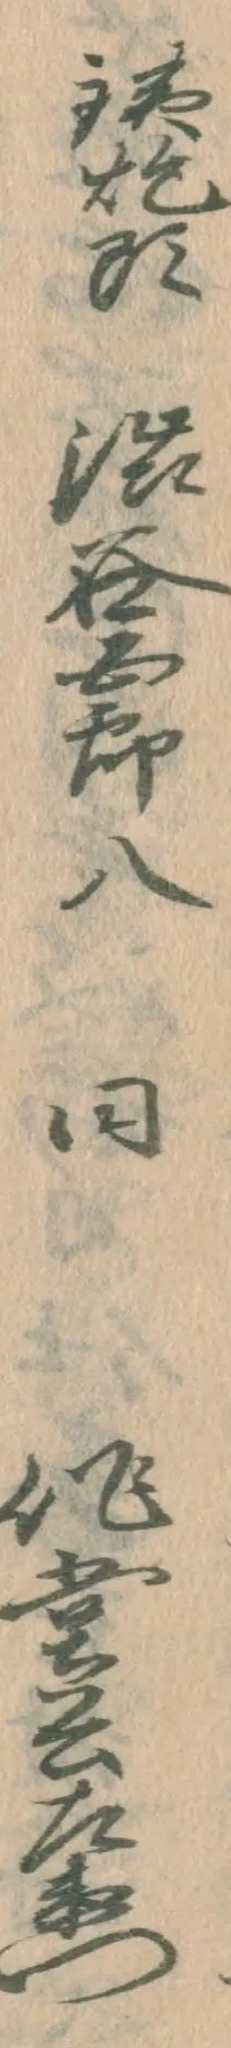鉄炮頭渋谷五郎八同作堂兵左衛門
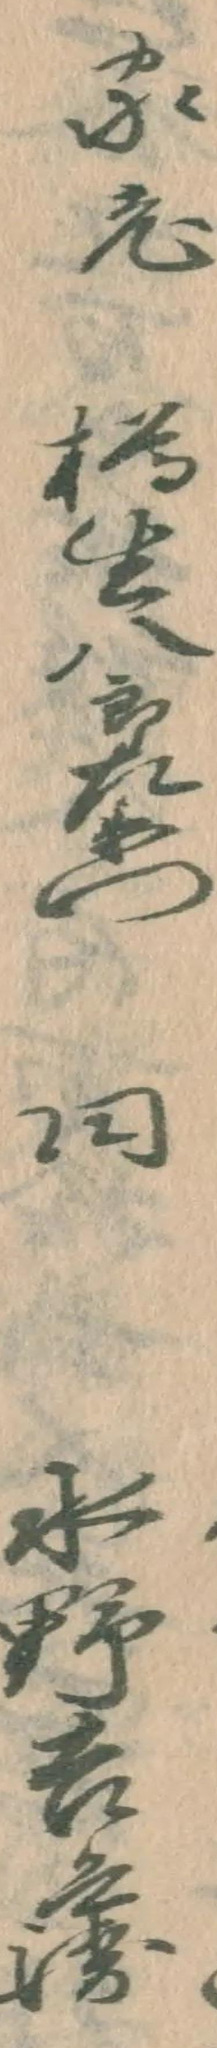家老樽生八郎左衛門同水野吉兵衛
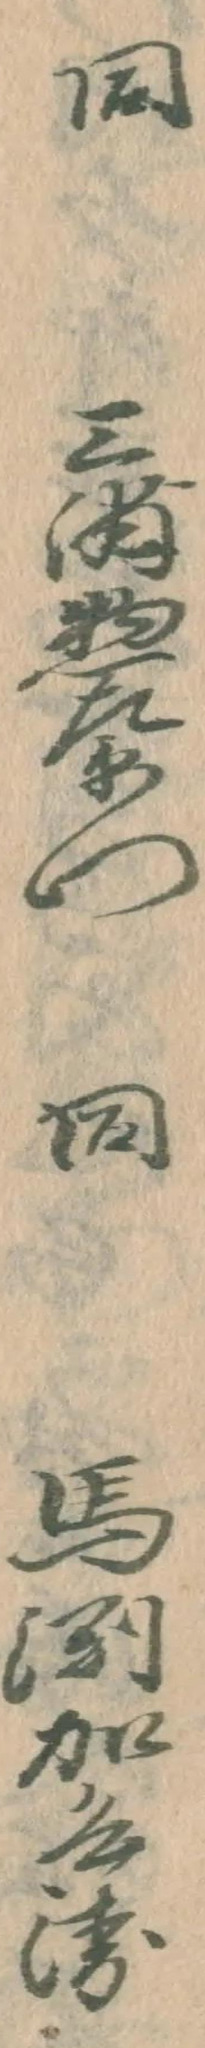同三浦惣左衛門同馬渕加兵衛
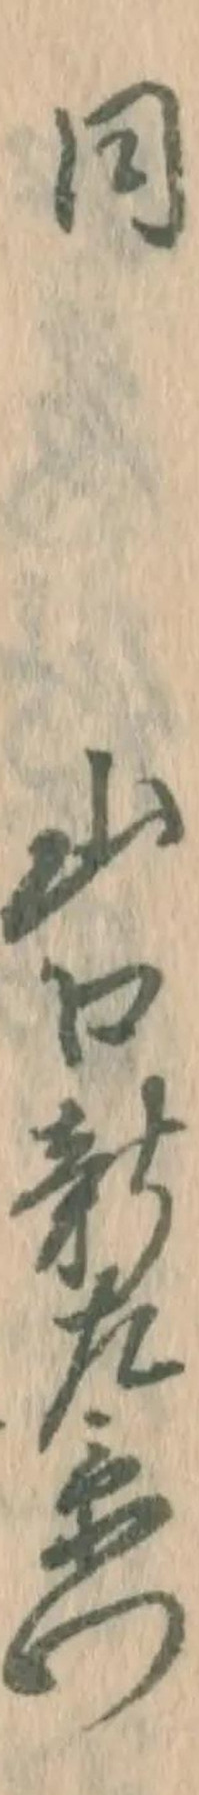同山口新左衛門
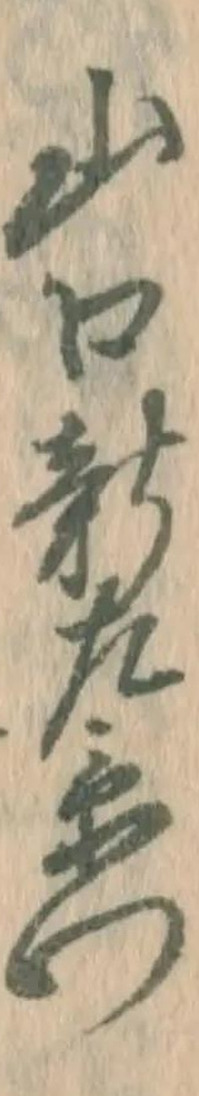同山口新左衛門
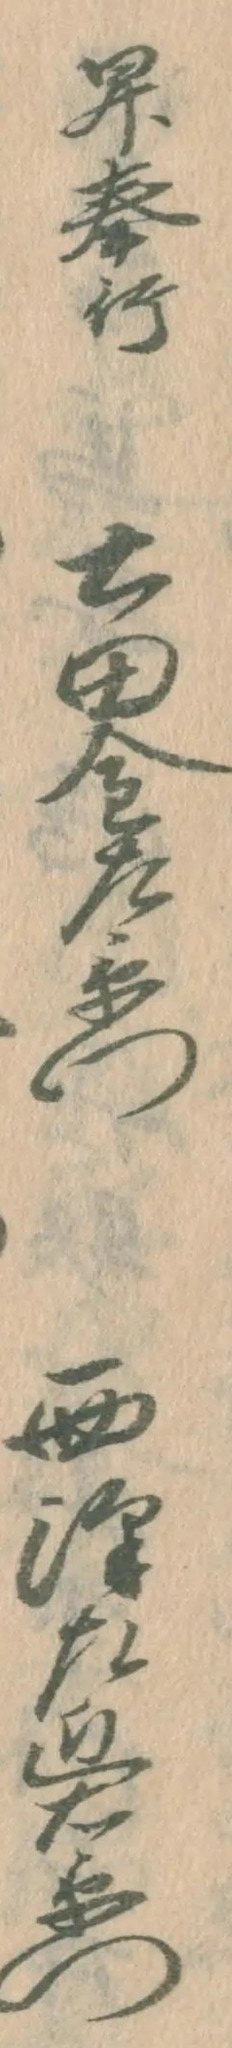昇奉行土田謹左衛門西沢左近右衛門
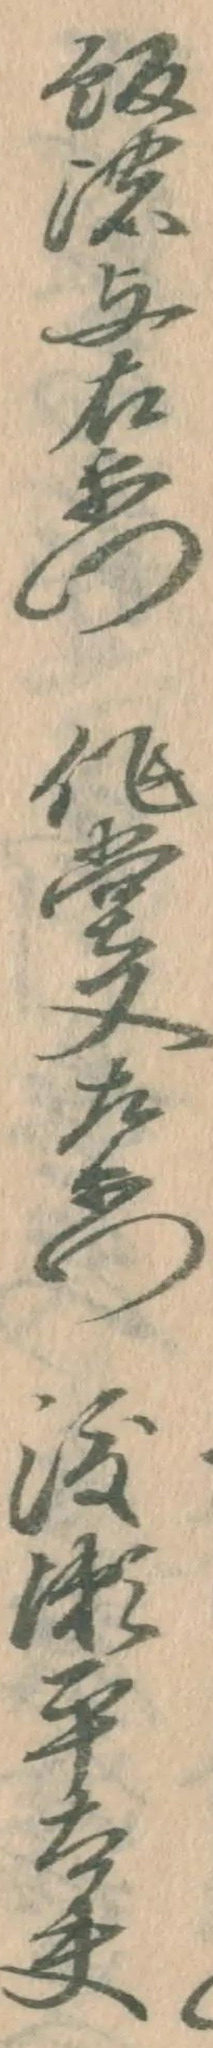飯濃与右衛門作堂又左衛門渡瀬并平太夫
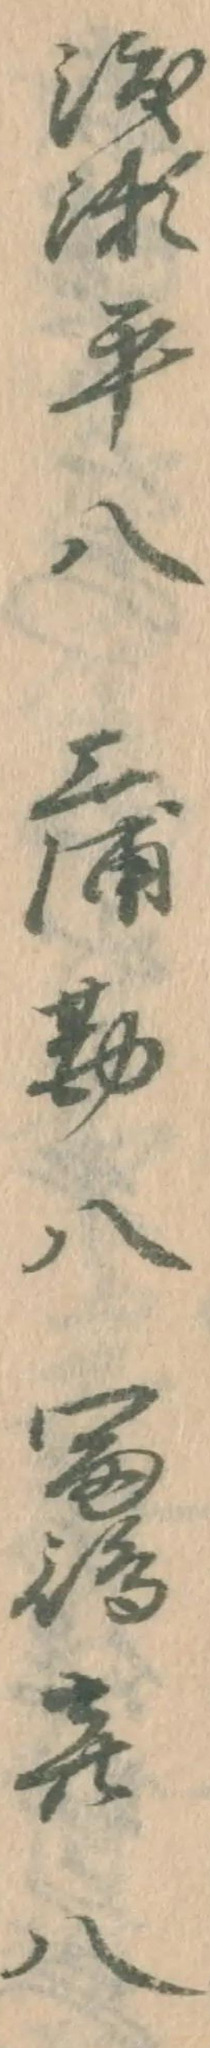渡瀬平八三浦勘八冨島喜八

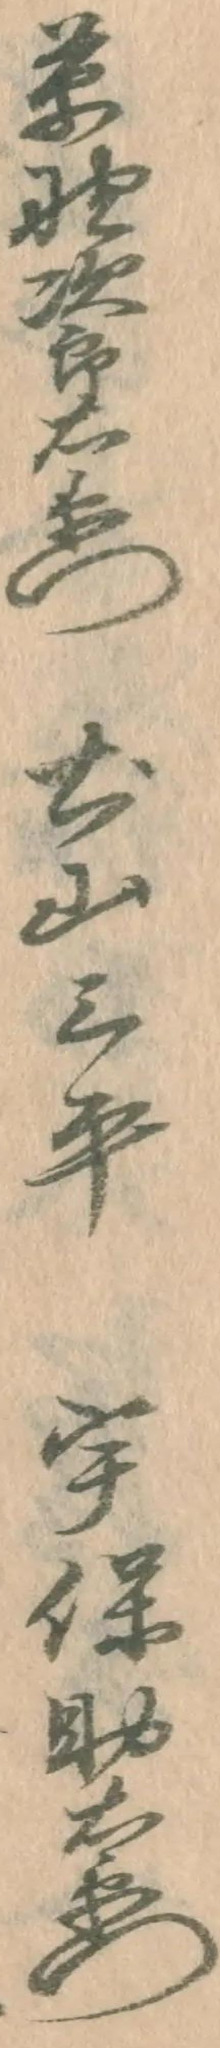草野次郎右衛門土山三平宇保助右衛門
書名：切支丹御退治記 49巻. [5]
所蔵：国立国会図書館 National Diet Library, JAPAN
